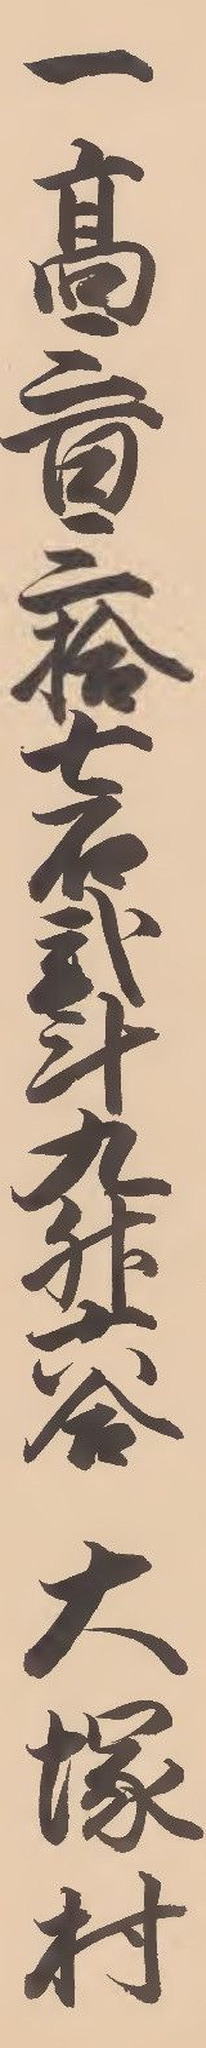一高三百三拾七石弐斗九升六合大塚村
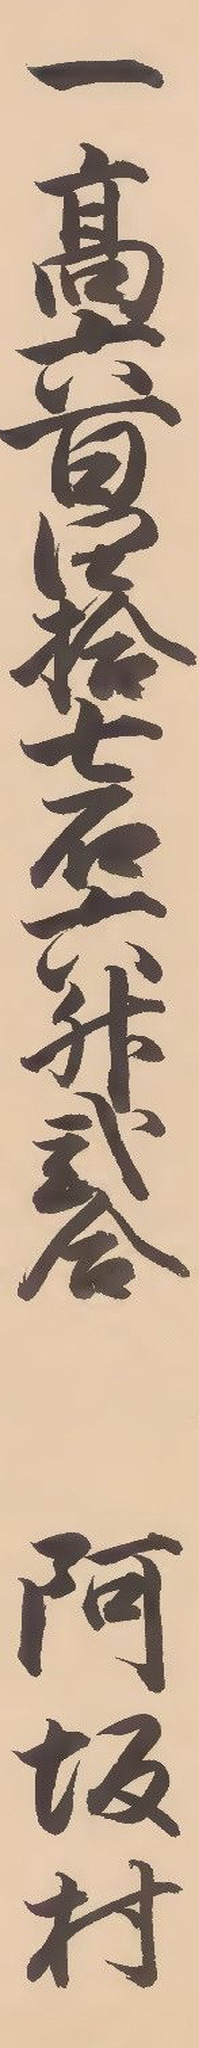一高六百四拾七石六升弐合阿坂村
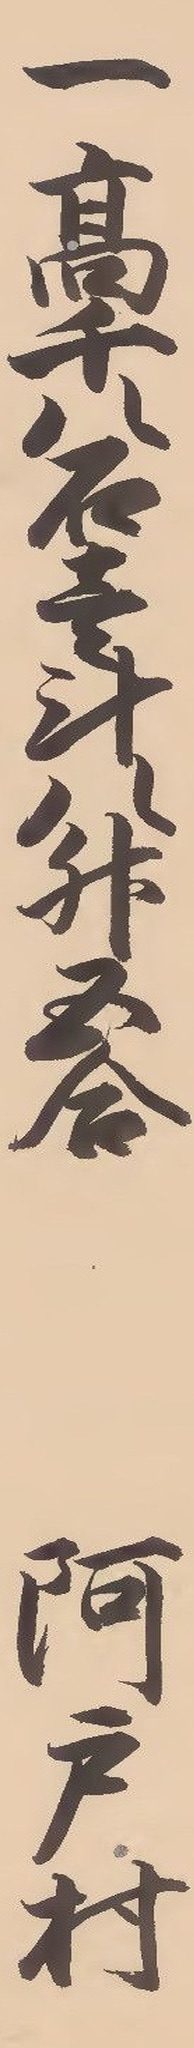一高千八石壱斗八升五合阿戸村
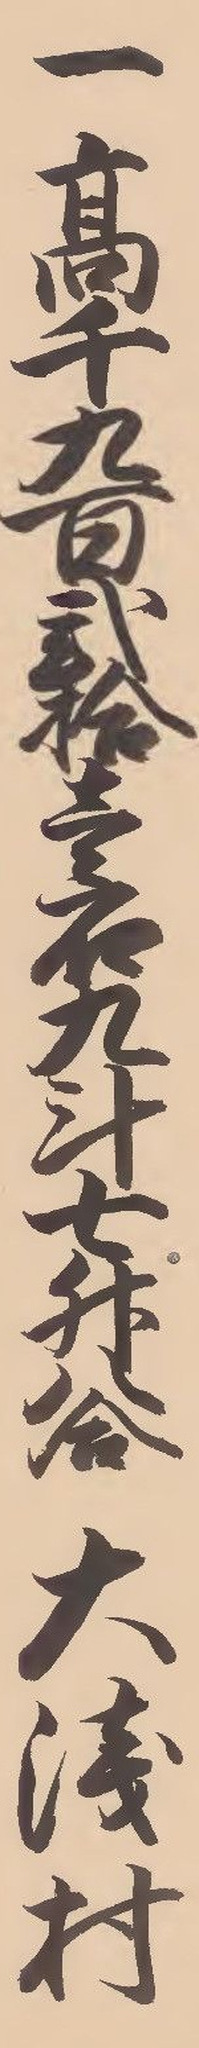一高千九百弐拾壱石九斗七升八合大浅村

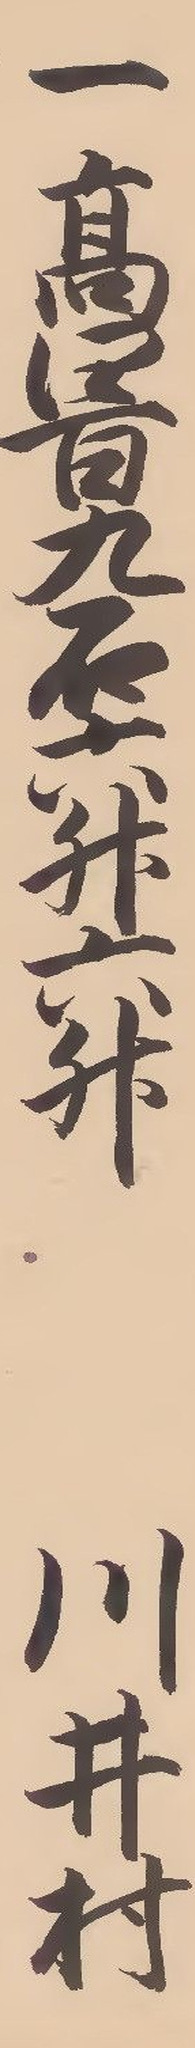一高四百九石六升六升川井村
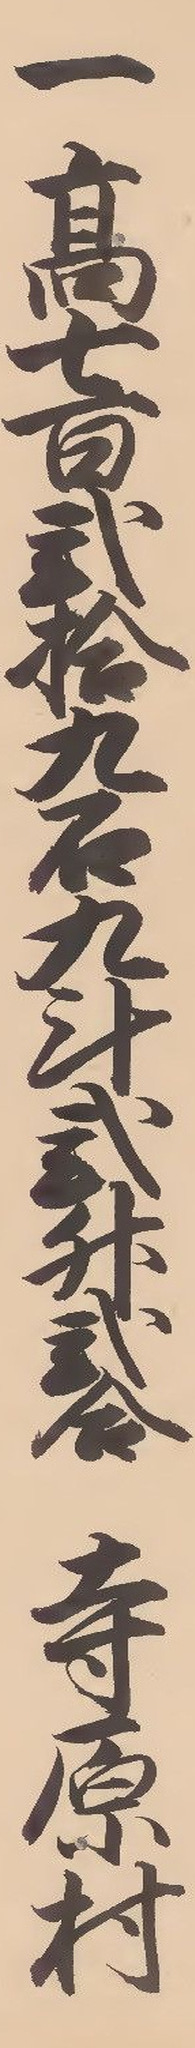一高七百弐拾九石九斗弐升弐合寺原村
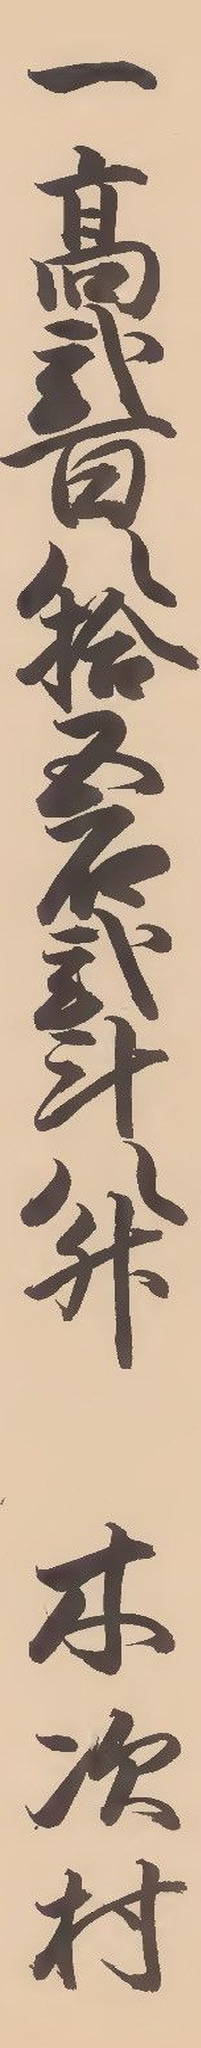一高弐百八拾五石弐斗八升木次村
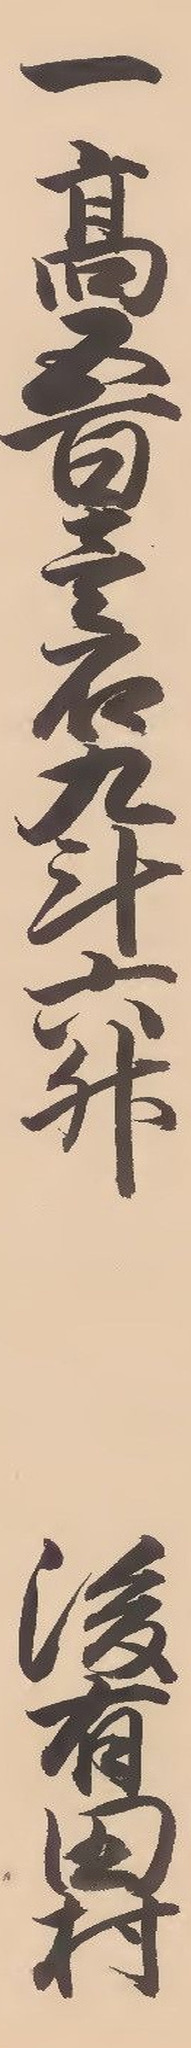一高五百壱石九斗六升後有田村
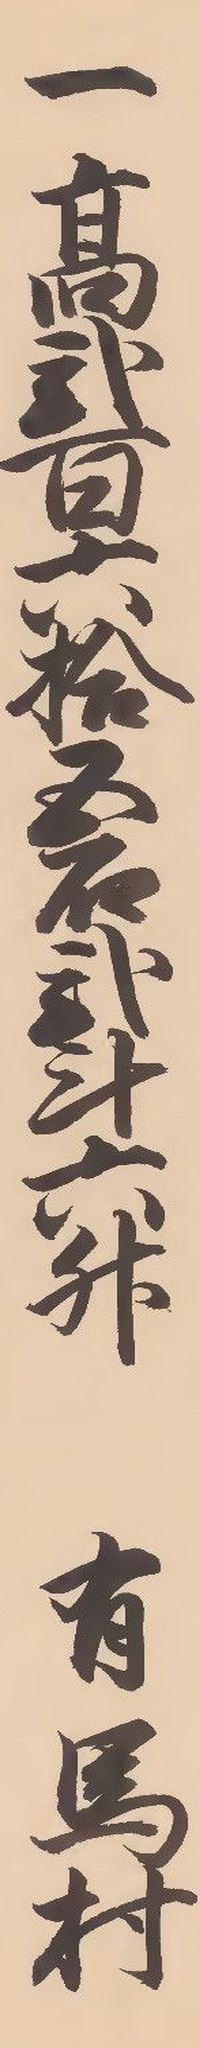一高弐百六拾五石弐斗六升有馬村
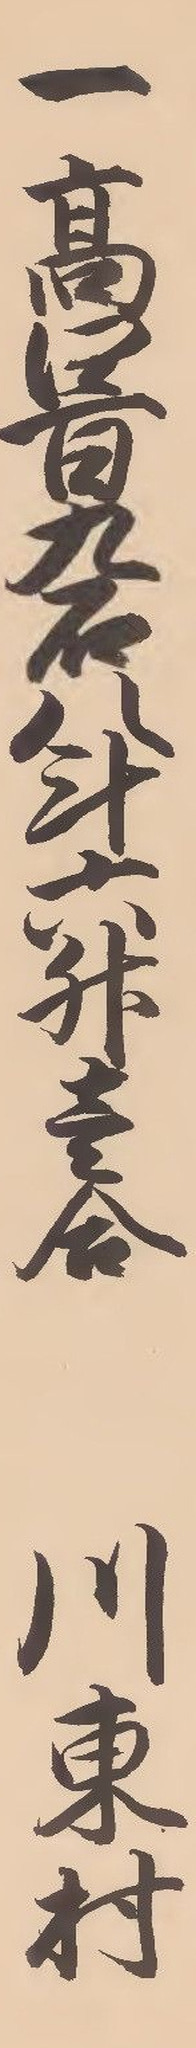一高四百九石八斗六升壱合川東村

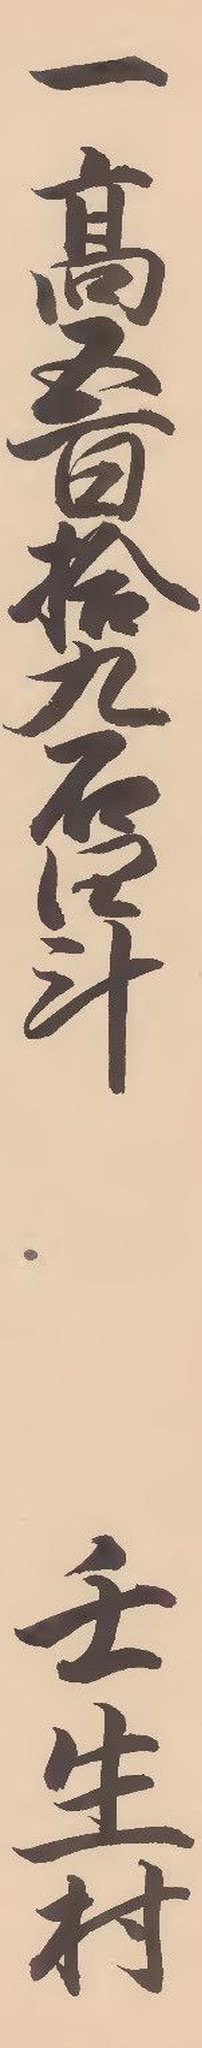一高五百拾九石四斗壬生村
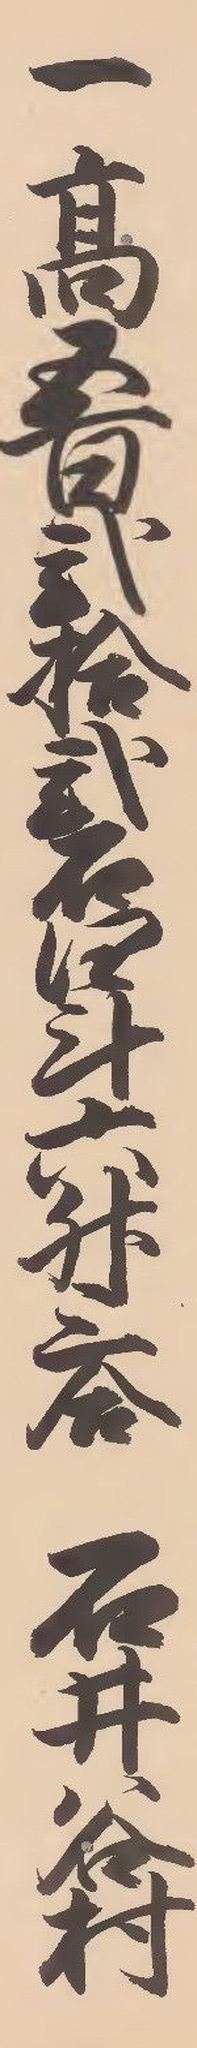一高五百弐拾弐石四斗六升三合石井谷村
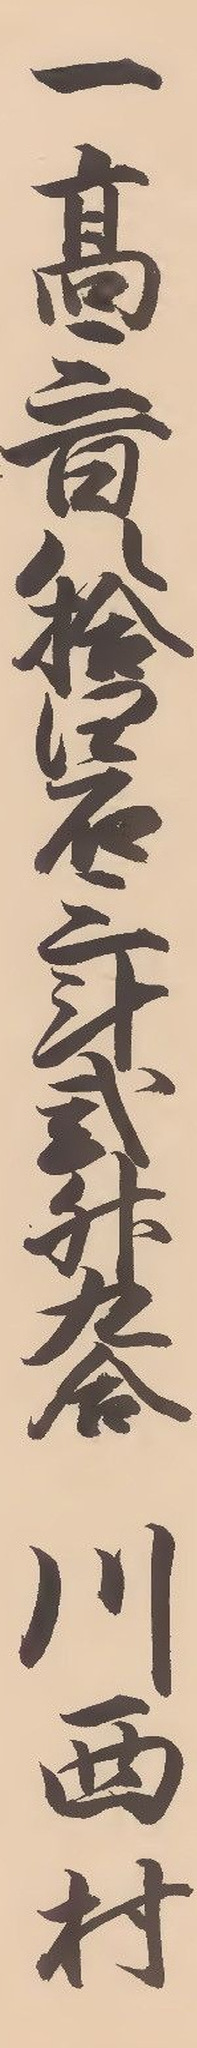一高三百八拾四石三斗弐升九合川西村
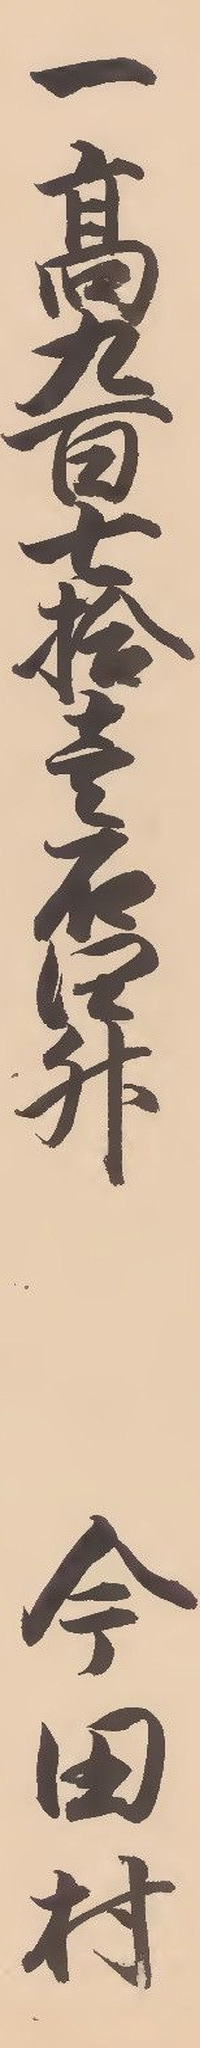一高九百七拾壱石四升今田村
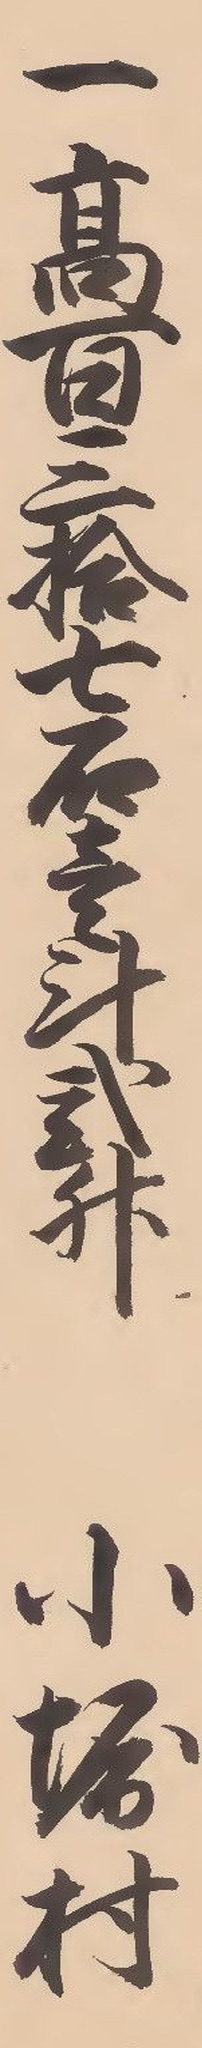一高百三拾七石壱斗弐升小堀村
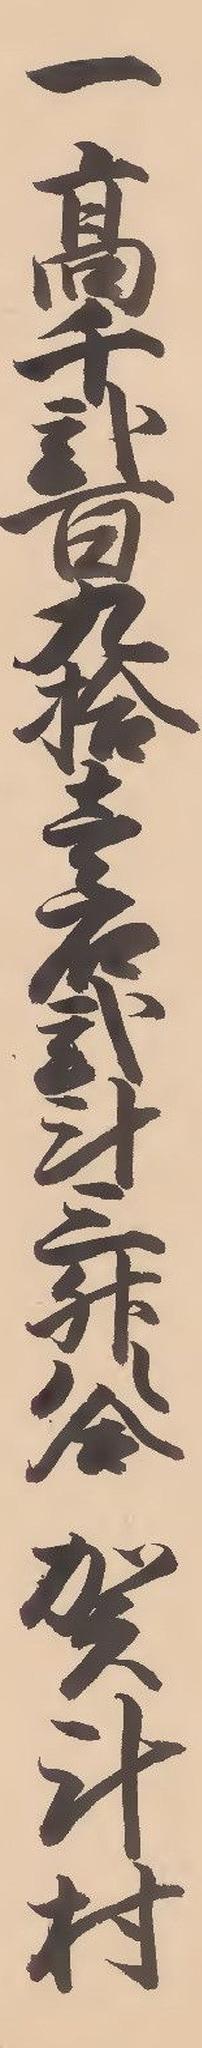一高千弐百九拾壱石弐斗三升八合賀計村
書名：安芸国郷帳
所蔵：国立公文書館 National Archives of Japan
